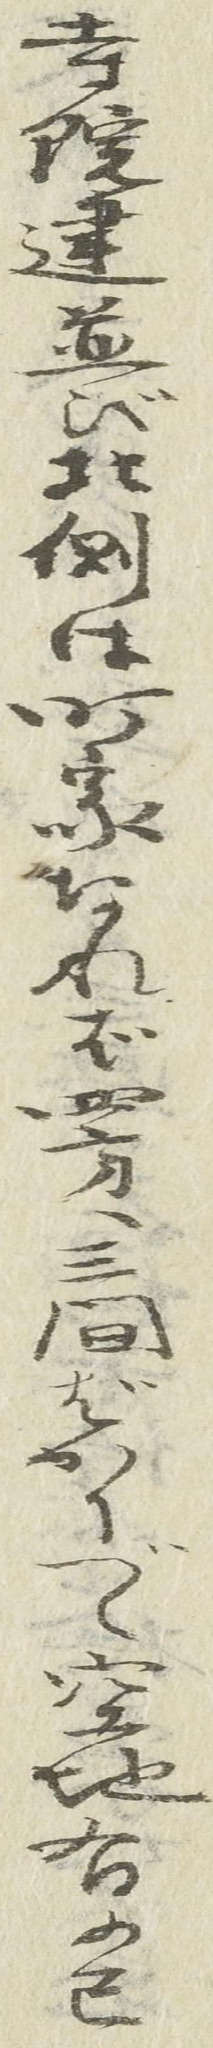寺院建並び北側は町家なれば四方へ三間ばかりづゝ空地有のみ
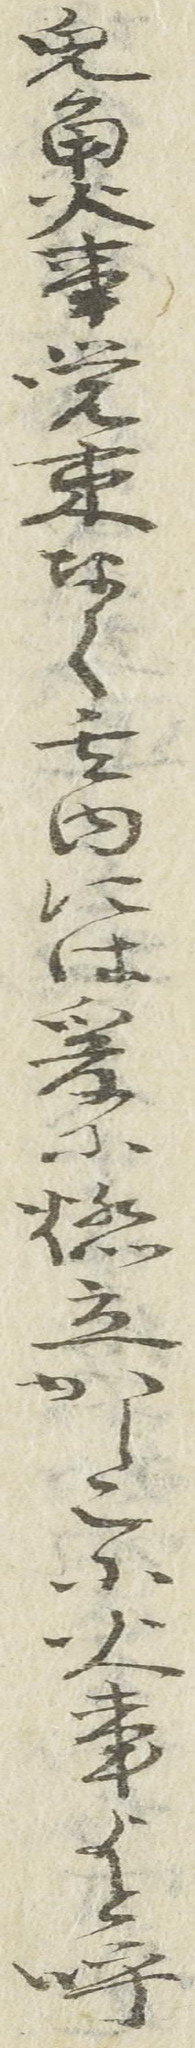兎角火事覚束なく其内には爰に燃立かしこに火事よと呼
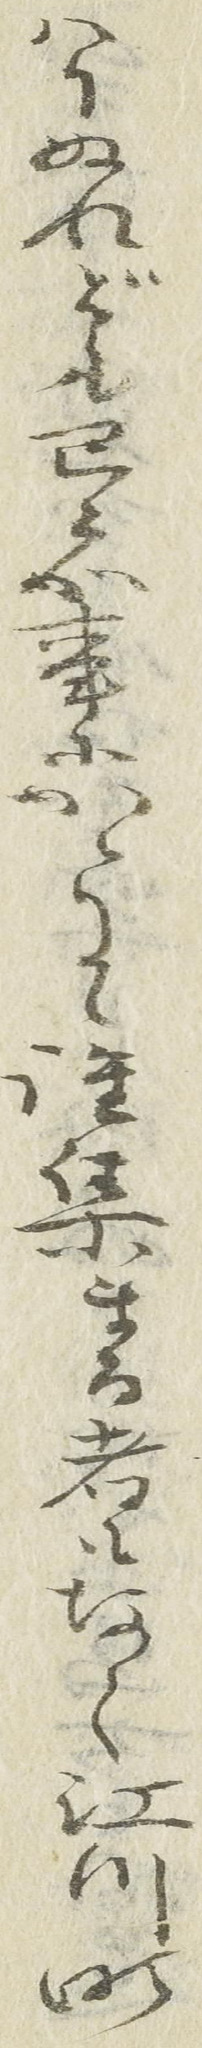はりぬれども己々か事にかゝりて誰集まる者もなく江川町
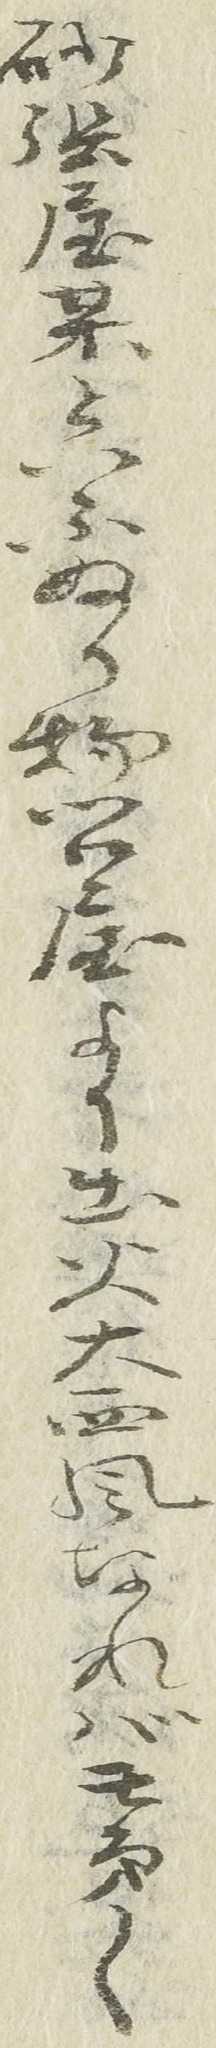砂張屋某といふぬり物問屋より出火大西風なれバ次第〳〵
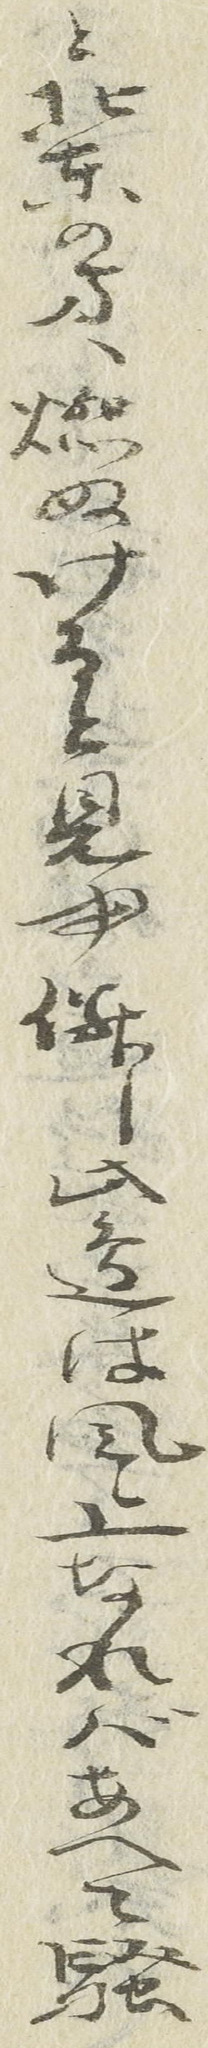と北東の方へ燃ぬけると見申併し此邊は風上なれバあへて騒
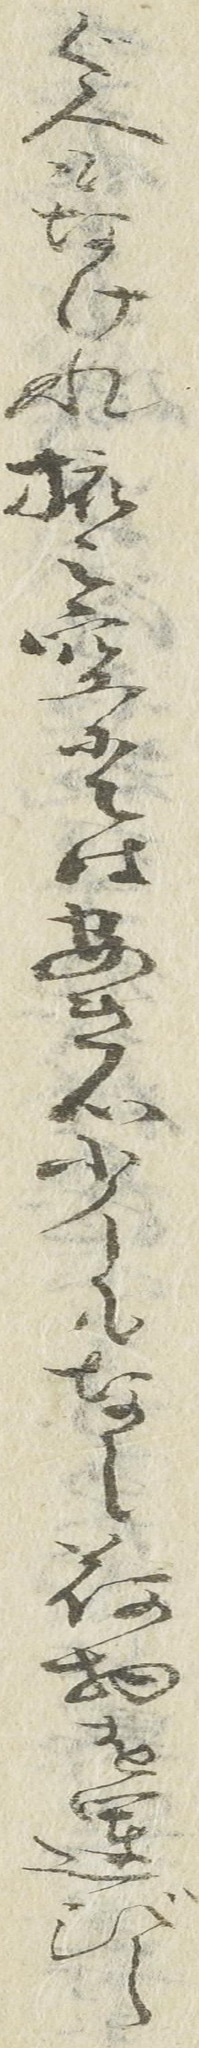ぐ人もなけれ旅之空にては安き心少しもなし荷物を運びし
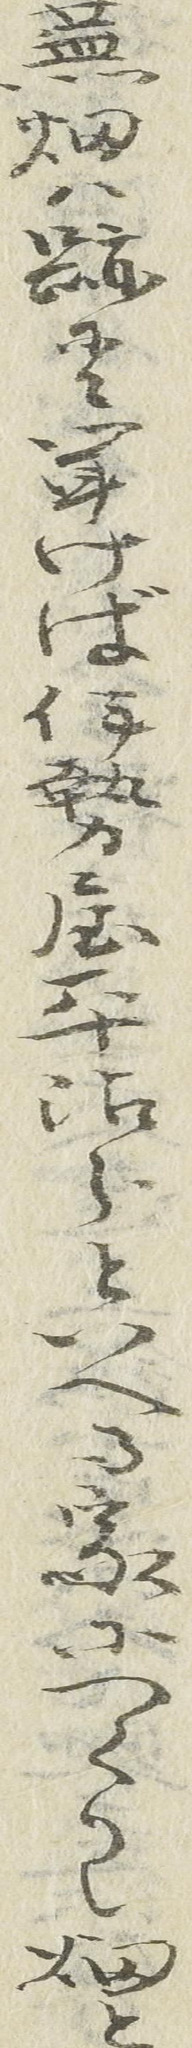蕪畑ハ跡にて聞けば伊勢屋平治らといへる家につくりし畑と
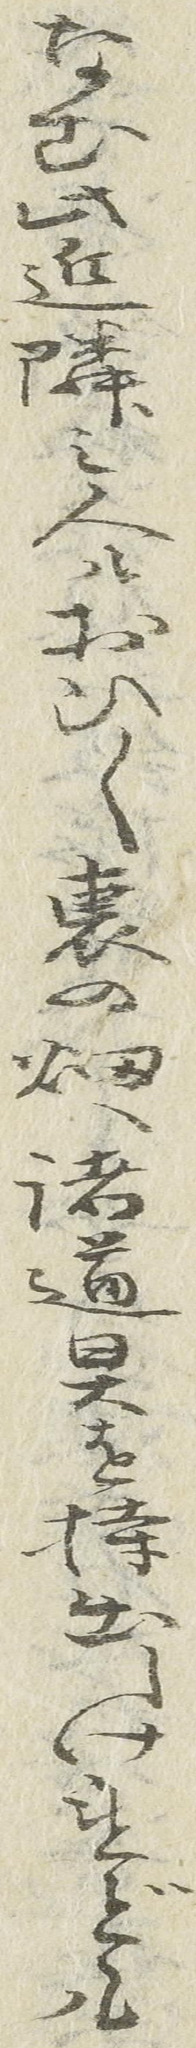なむ此近隣之人もおひ〳〵裏の畑へ諸道具を持出しけれども
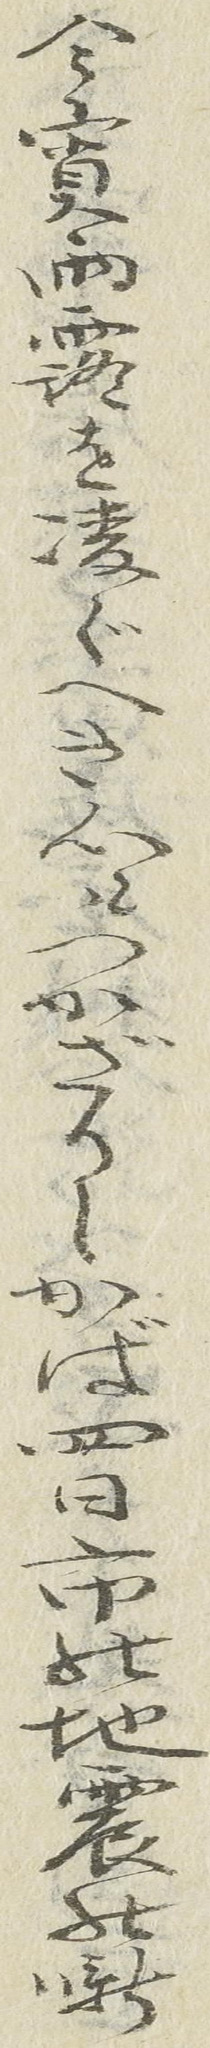今宵ハ雨露を凌ぐへき心もつかざりしかば四日市の地震の噺
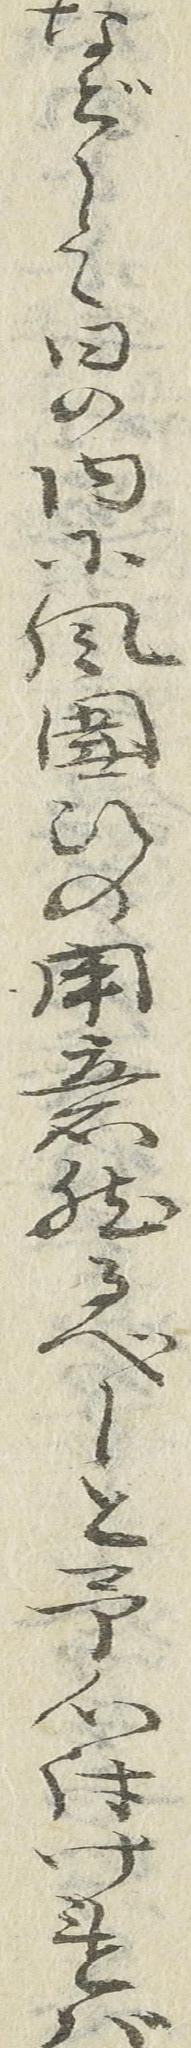などして日の内に風囲ひの用意然るべしと予心付けれバ
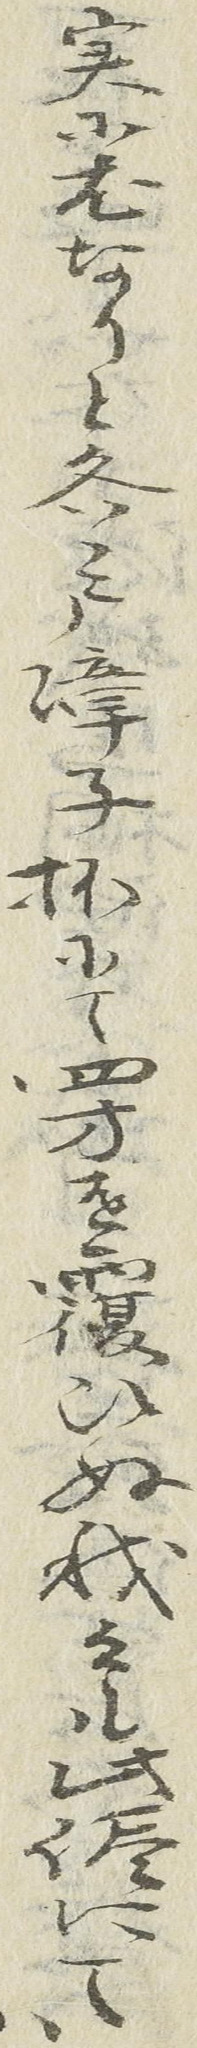実に尤なりと各々戸障子抔にて四方を覆ひぬ我々も此侭にてハ

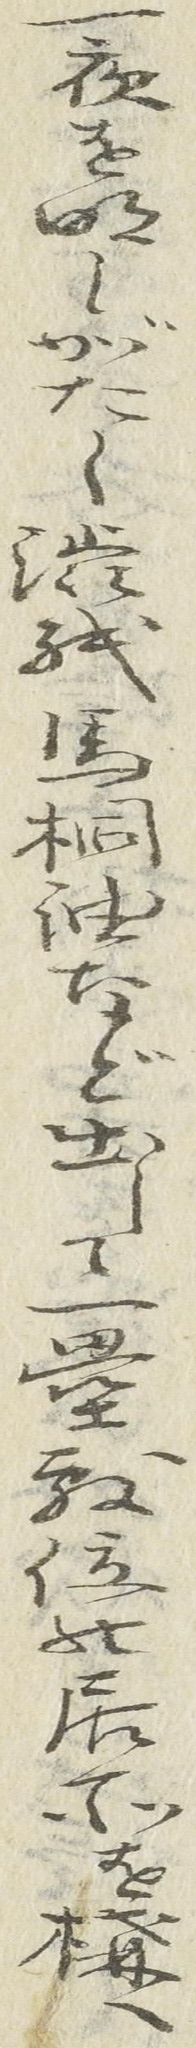一夜を明しがたく渋紙馬桐油など出して一畳敷位の居所を構へ
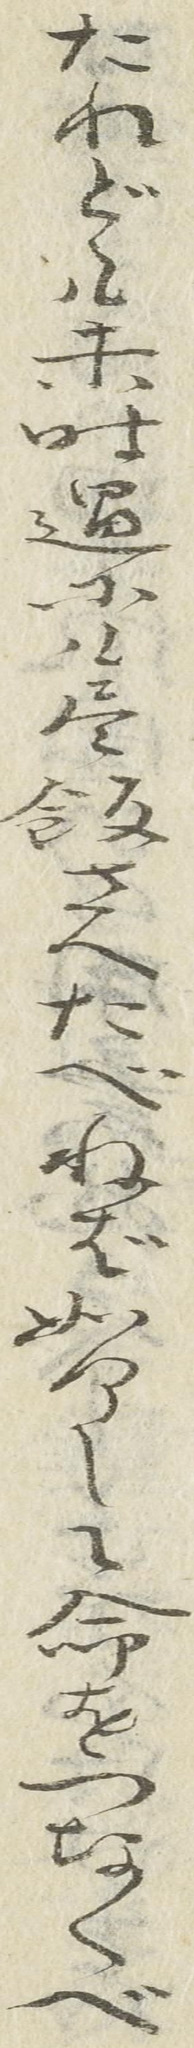たれども未時過にも尽飯さへたべねば如何して命をつなくべ
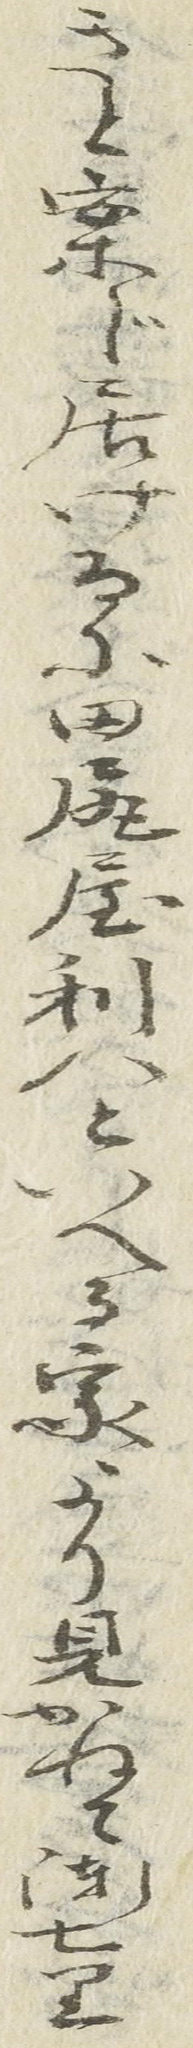きと案じ居けるに田尻屋利八といへる家より見かねて漸七り
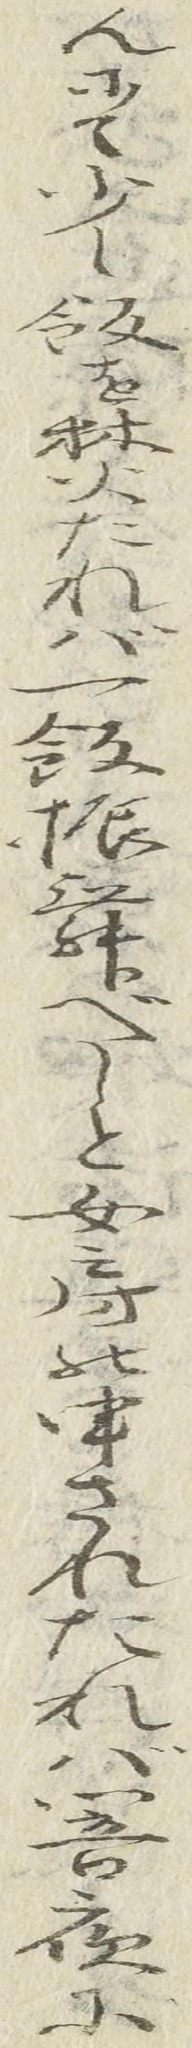んにて少し飯を焚たれば一飯振舞べしと女房の申されたれば闇夜に
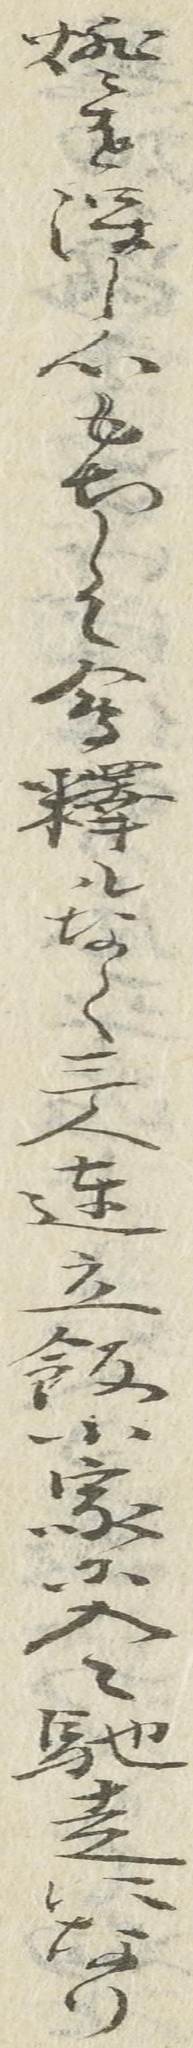燈を得し心もちして会釈もなく三人連立飯小家に入て馳走になり
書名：地震前兆集　全
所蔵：東京大学地震研究所図書室 Earthquake Research Institute Library, The University of Tokyo, JAPAN
